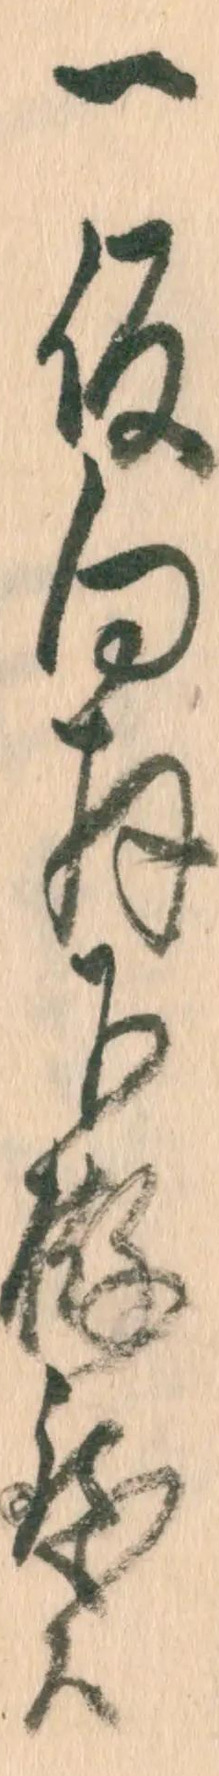一仮向拝下拵致候
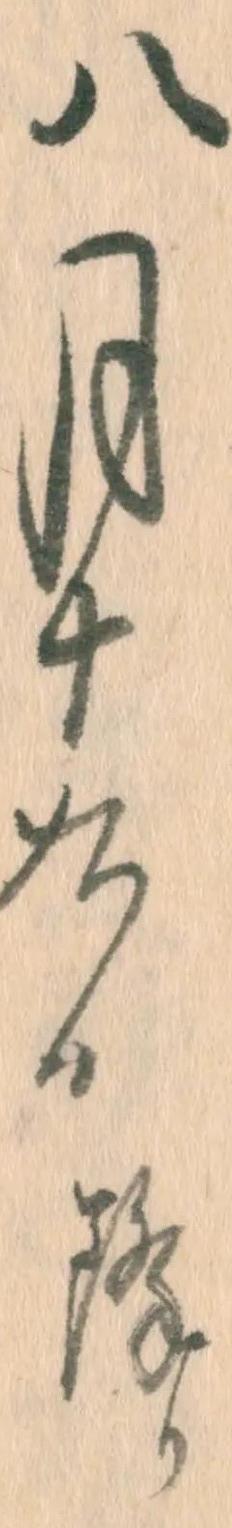八月十九日降り
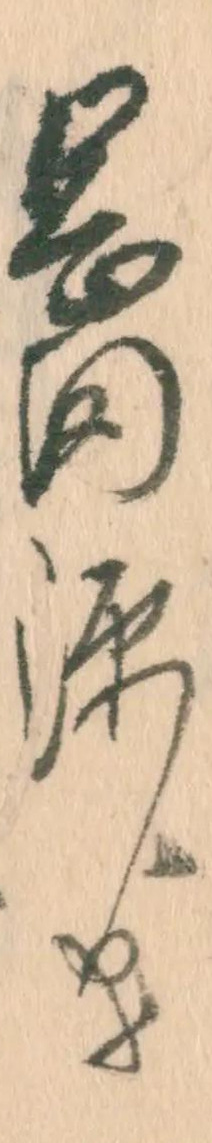岡田源兵衛
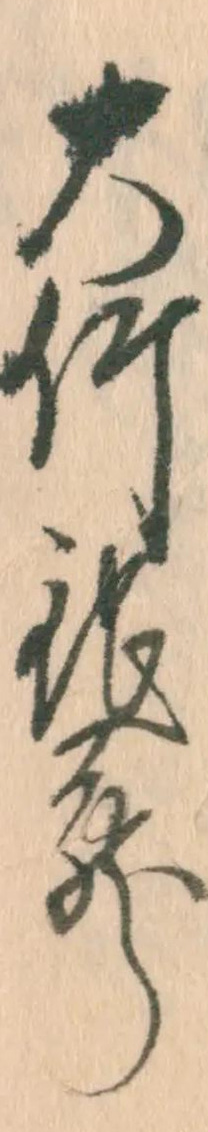大竹銀蔵
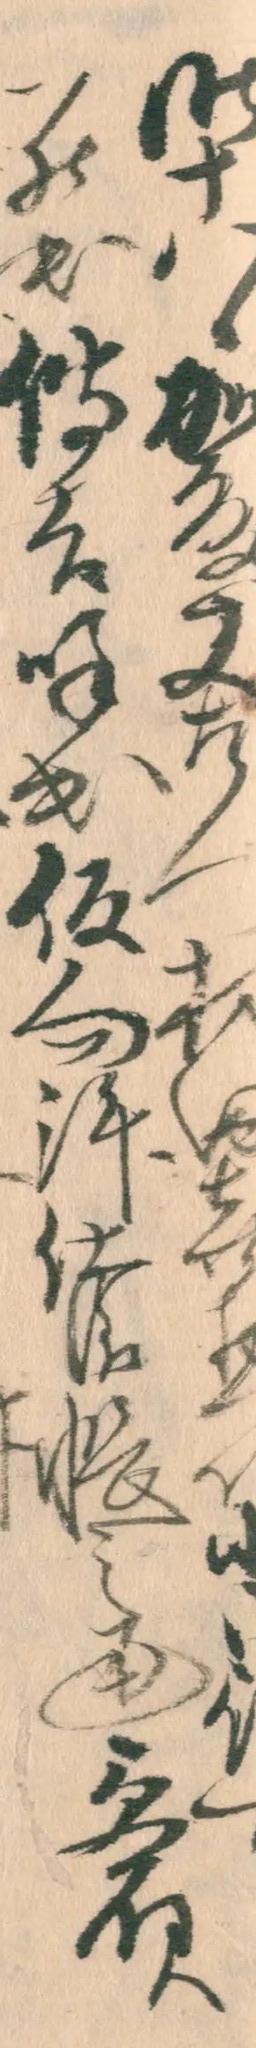罷出伝吉呼出仮向拝許仕様帳之通り請負人
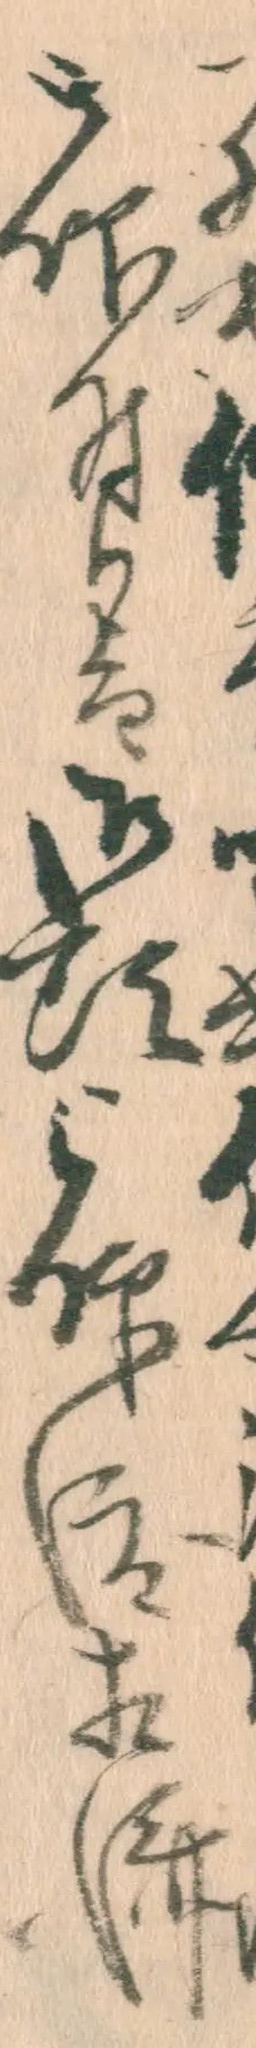被仰付候旨御頭被仰渡相済
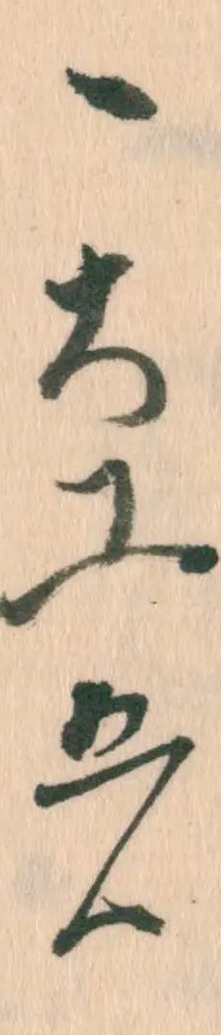一大工弐人
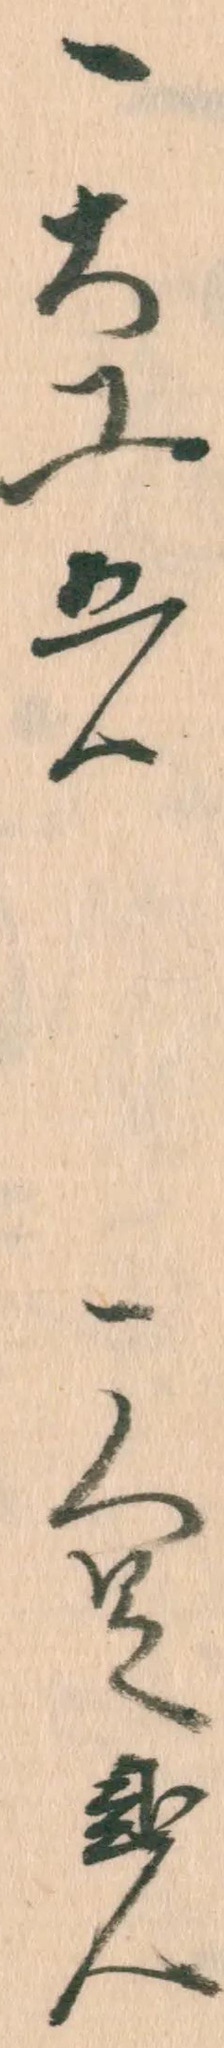一大工五人一人足弐人
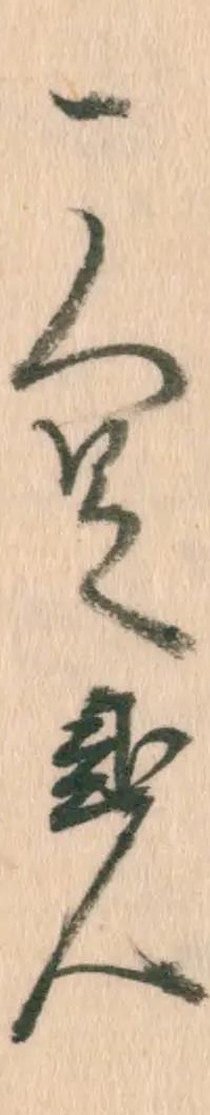一大工弐人
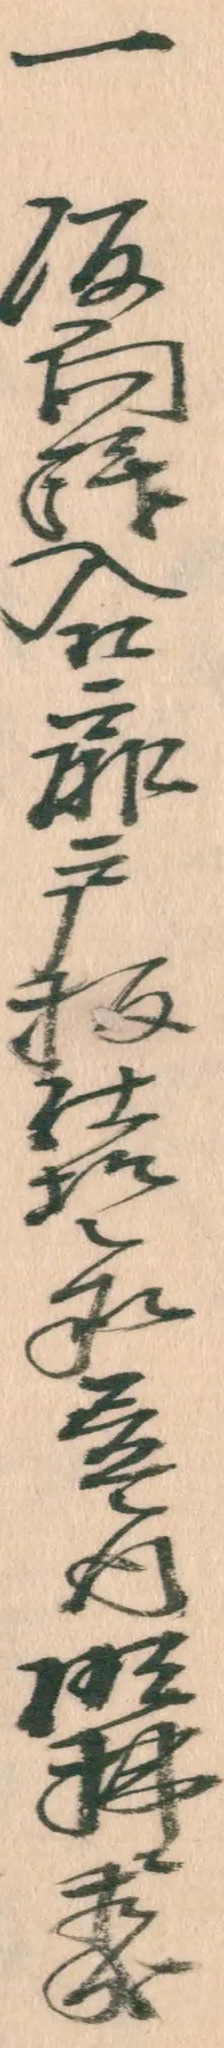一仮向拝入口扉戸板仕損之処昼之内明払ニ相成
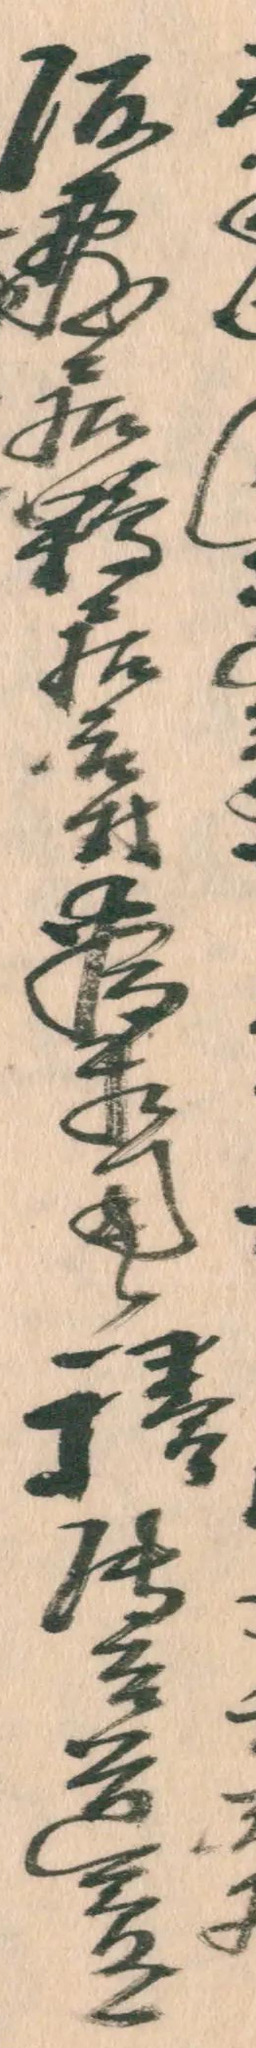仮覆居鴨居取付為相用候積伝吉道菅へ
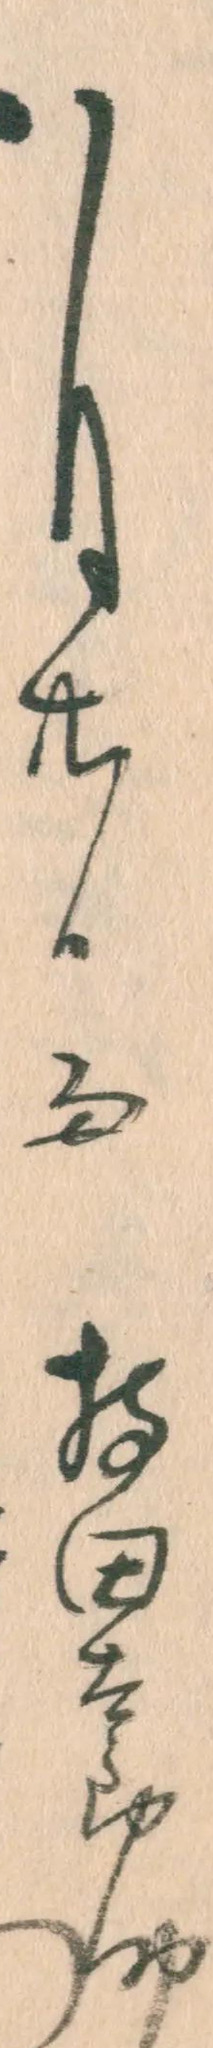八月廿日雨持田太郎助
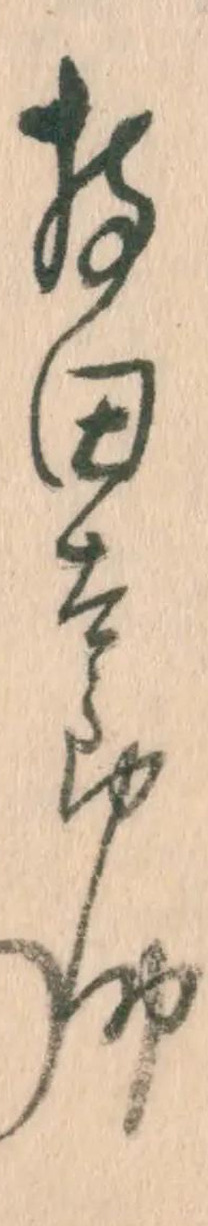持田太郎介
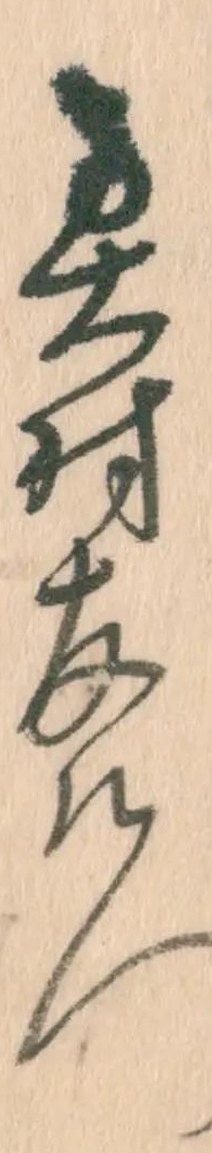奥村友左衛門
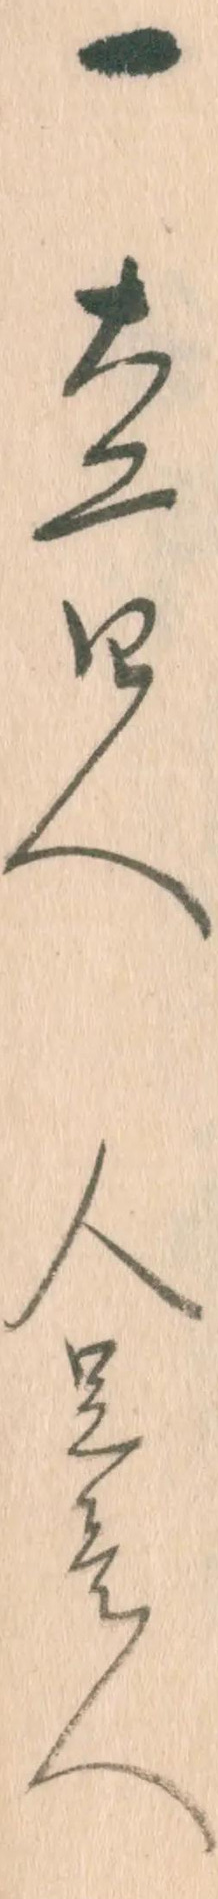一大工四人人足壱人

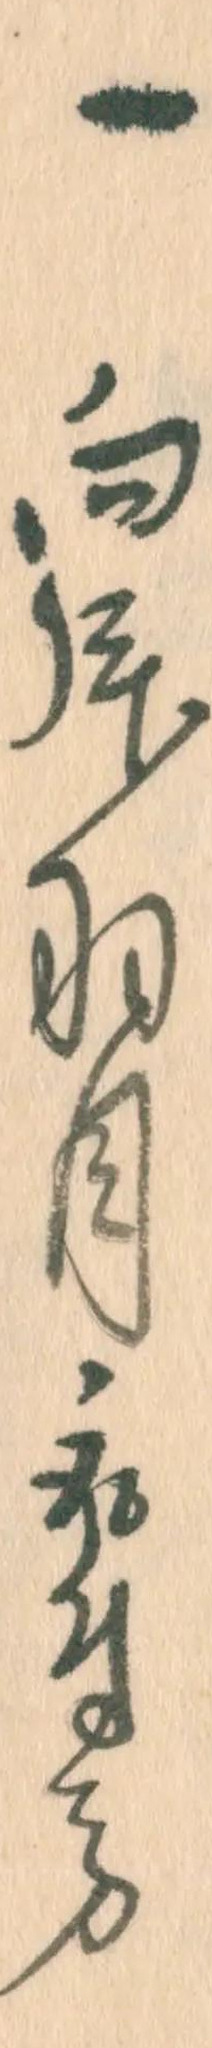一向拝羽目取付方
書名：三十三間堂. [2]
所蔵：国立国会図書館 National Diet Library, JAPAN
